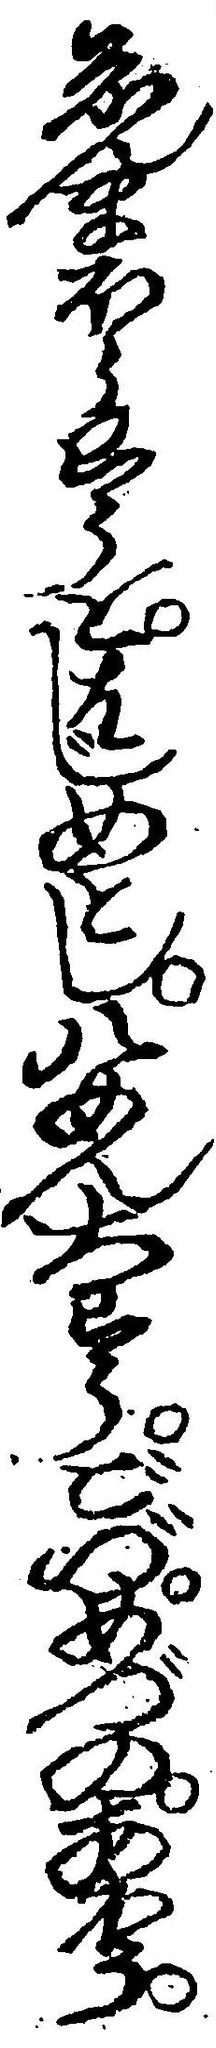ゑんまほうわうを。はじめとし。八めん大わう。ごづ。めづの。あほう。
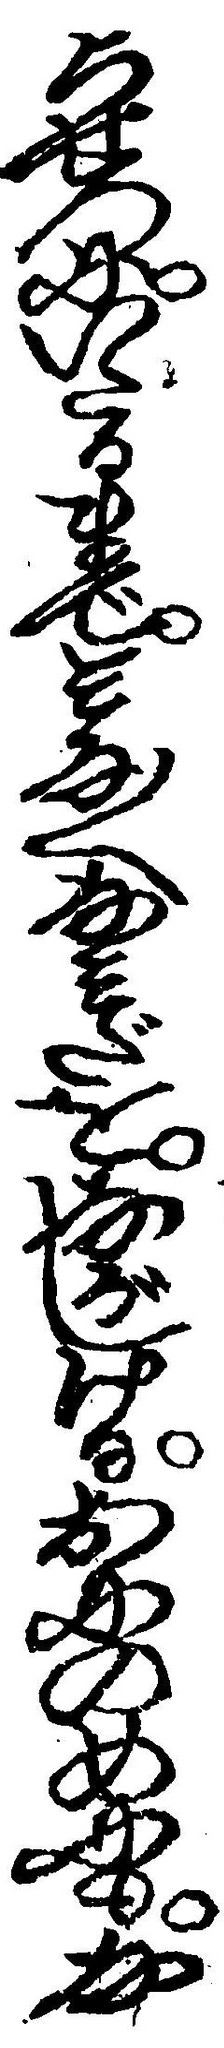らせつに。いたるまで。みな〳〵なみだを。ながしける。おにのめにも。な
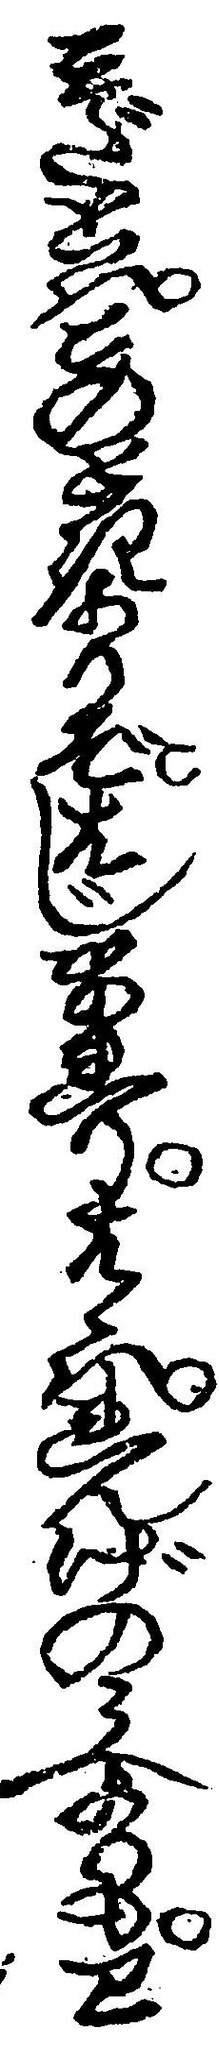みだとは。このときよりぞはじまれり。はゝは。れんげのうへよりも。わ
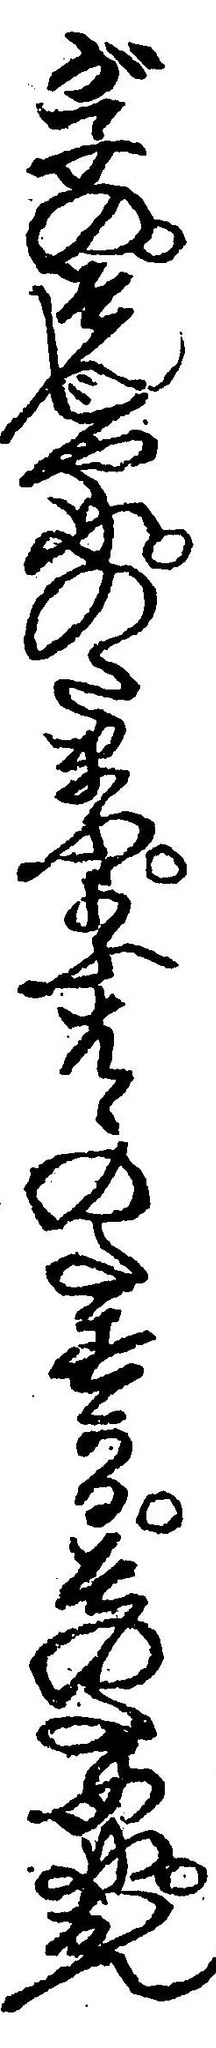が子の。そんじやに。のたまふよふ。はゝのたすかる。そのために。おん
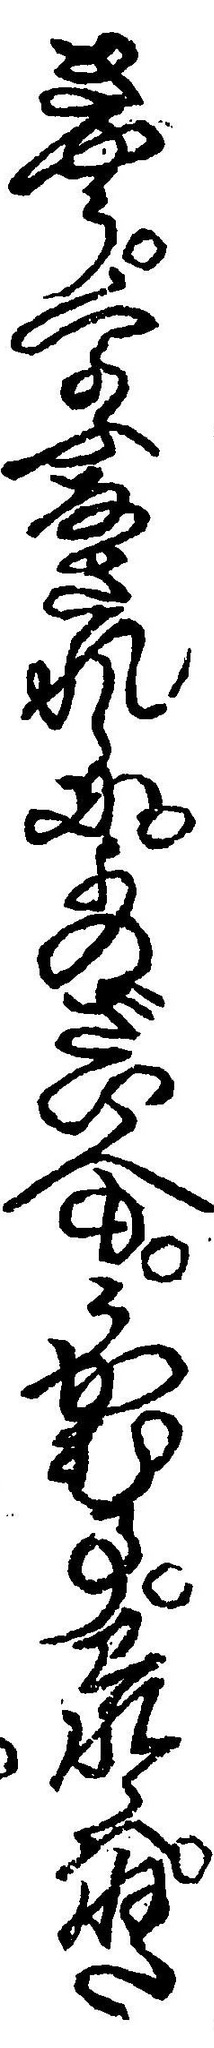きやう。くよふなされしに。よのざい人も。うかむ事。われらは。ねた
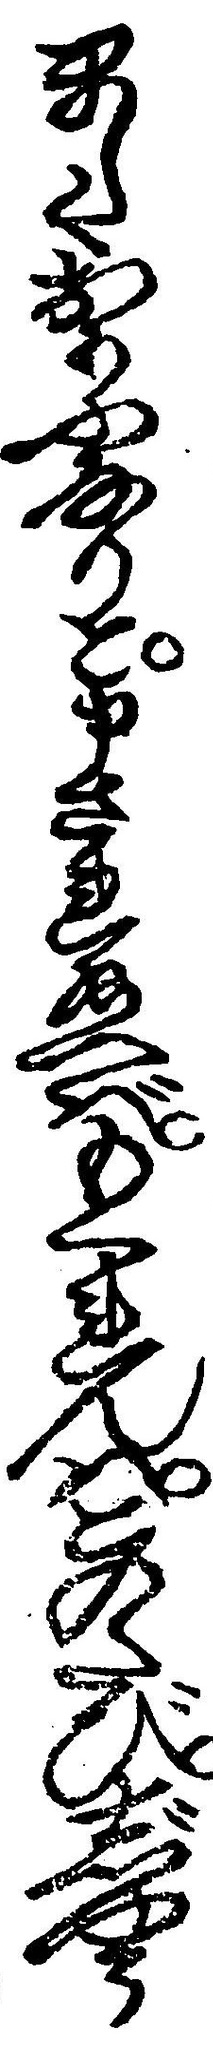ましくおもふなりと。申され給へば。もくれんは。このたび。じやう
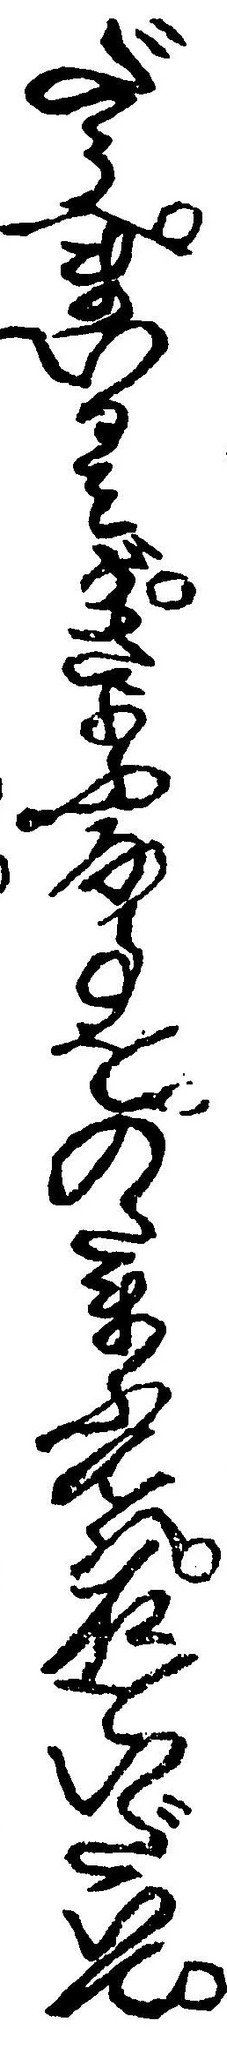だうへ。まいるみが。さよふな事をのたまふては。石をいだいて。
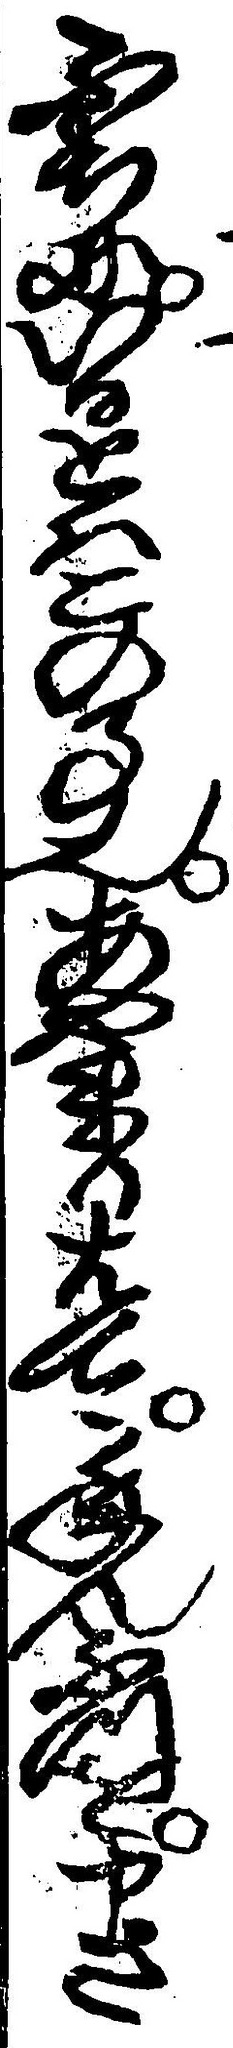ふちに。いるとはこの事也。あやまりはてゝ。ねんふつを。申さ
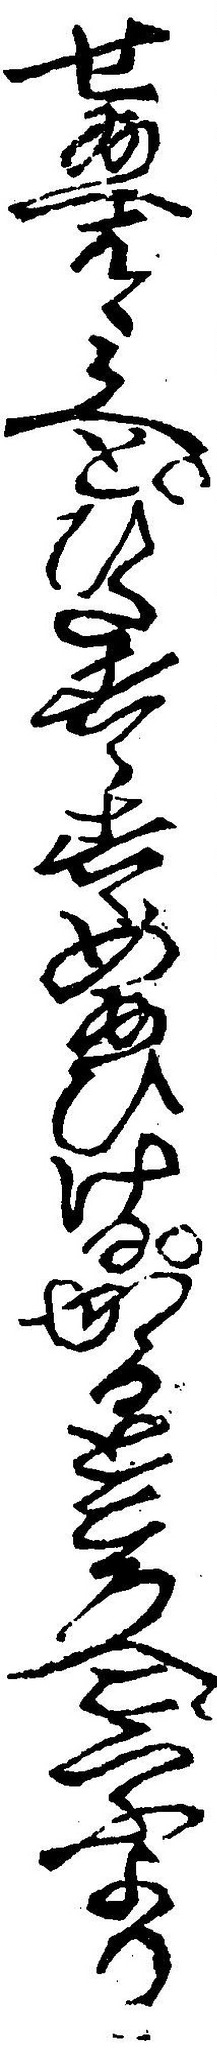せ給へはゝうへと。ひたすらすゝめ給ひける。かゝるところへ。こくふより
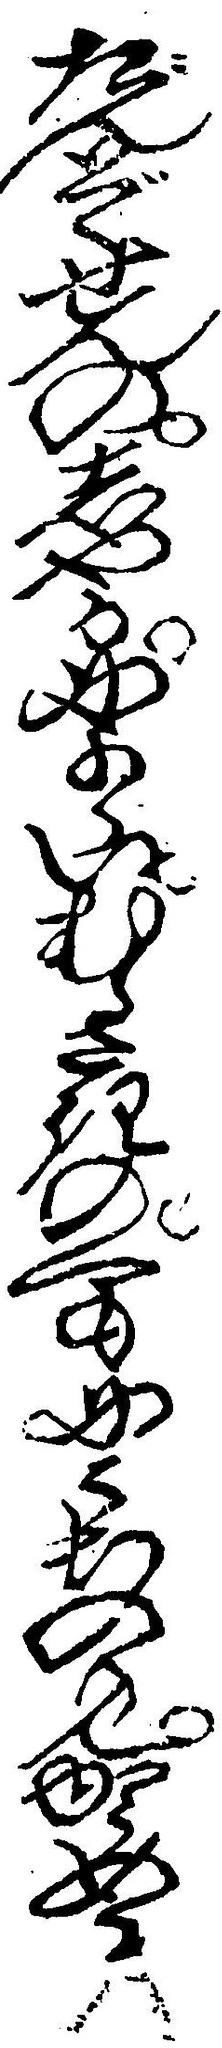だんどくせんの。しやか。によらい。むらさきの。くもにうちのりて。かうめう
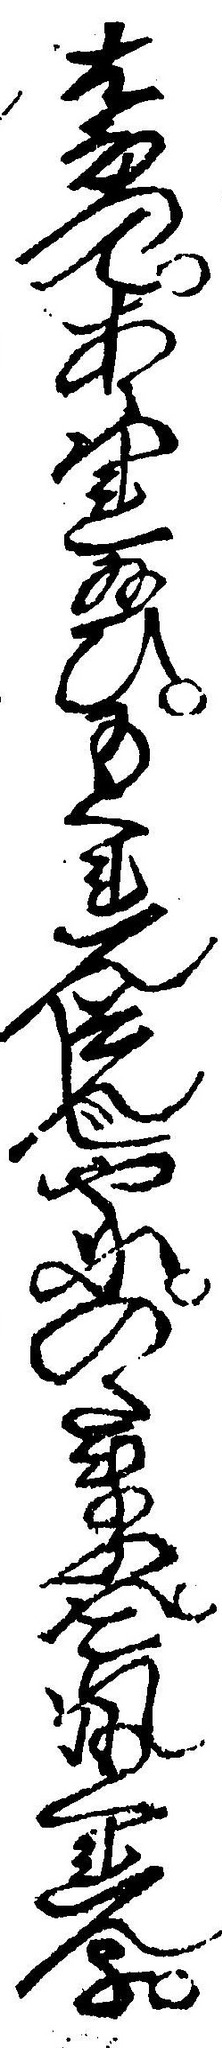はなつて。あらはれ給ひ。もくれんそんじやに。のたまふは。これもくれんよ。
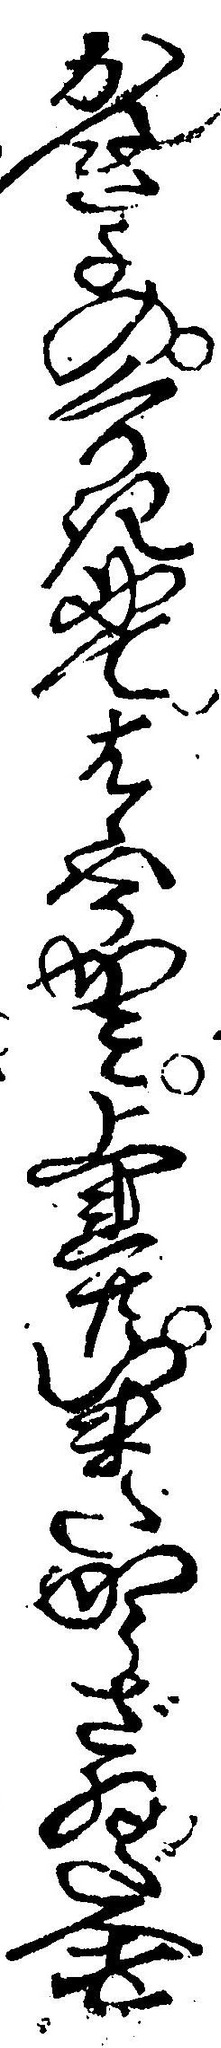おんきよの。くりきにて。はゝはうかみ。上れ共。いまたかうざゐたへす
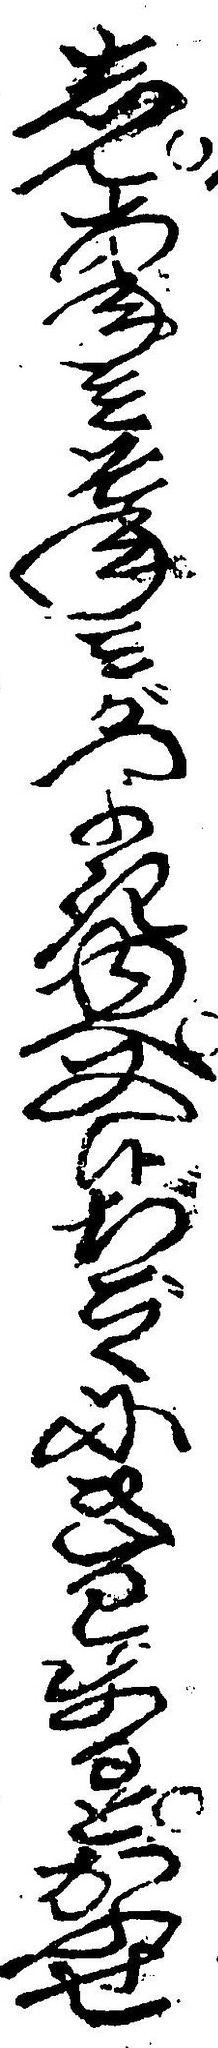して。あねみそねみがつよきゆへ。又候ぢごくにきわまると。おふせ
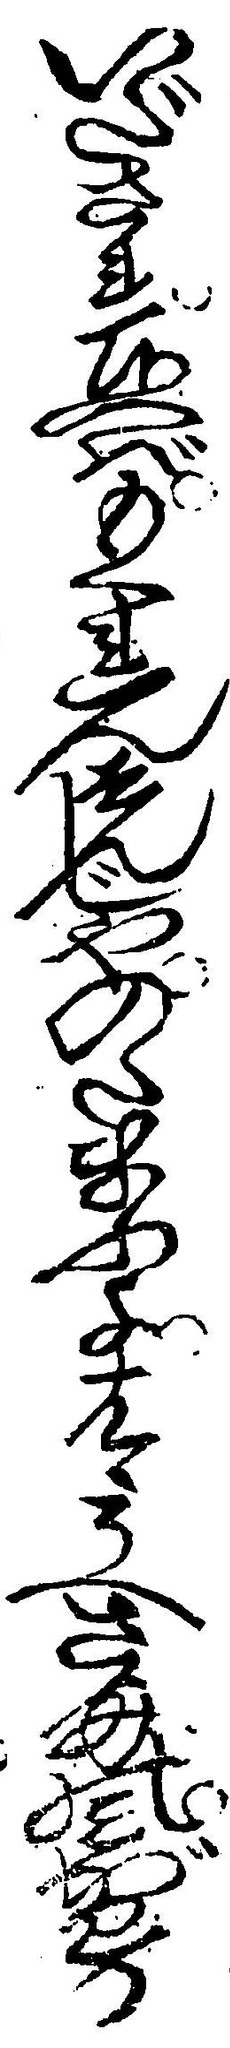いだされ。候へば。もくれんそんじや。のたまふに。はゝうへさまの。みがわり
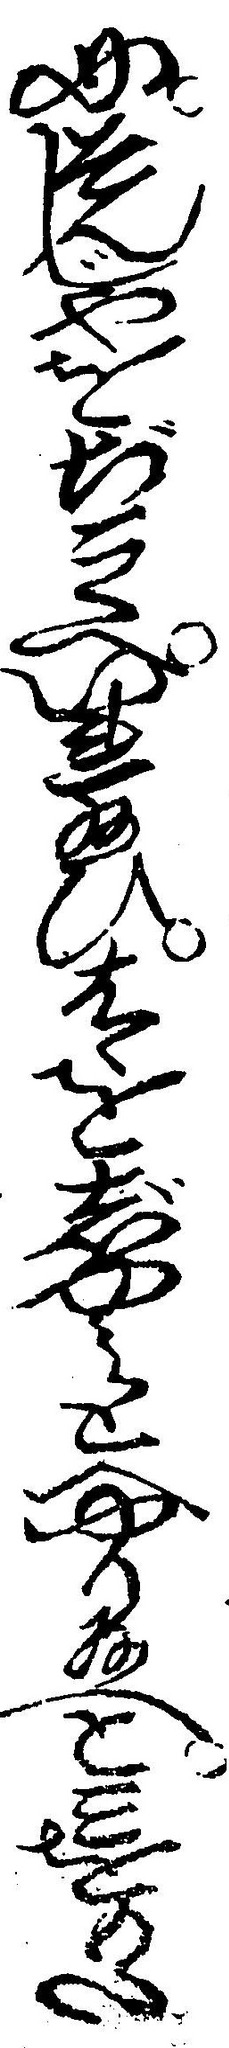にそんじやをぢこくへ。いれ給ひ。はゝをじやうとへやり給へと。みをもた
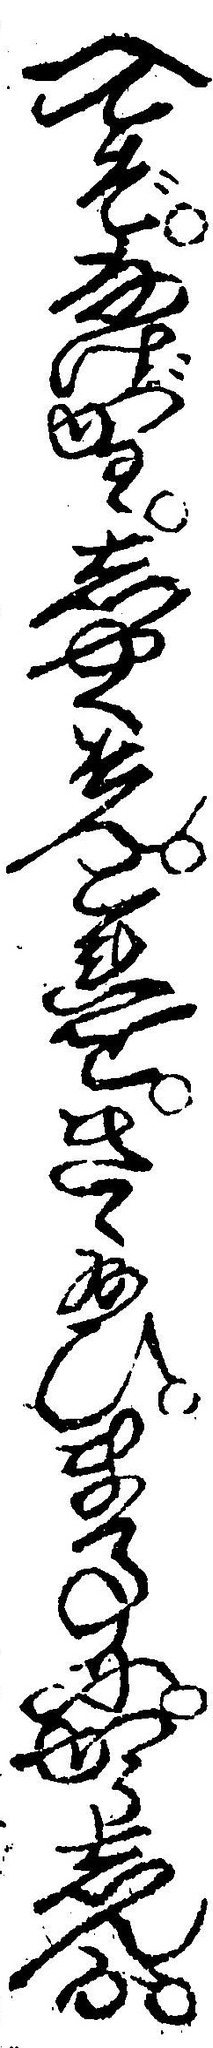へてぞ。なげかるゝ。しやくそん。これを。きゝ給ひ。ま事に。かうしんが。
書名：目連尊者地獄めくり / 宇留藤太夫正本
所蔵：東京大学総合図書館 General Library in the University of Tokyo, JAPAN
